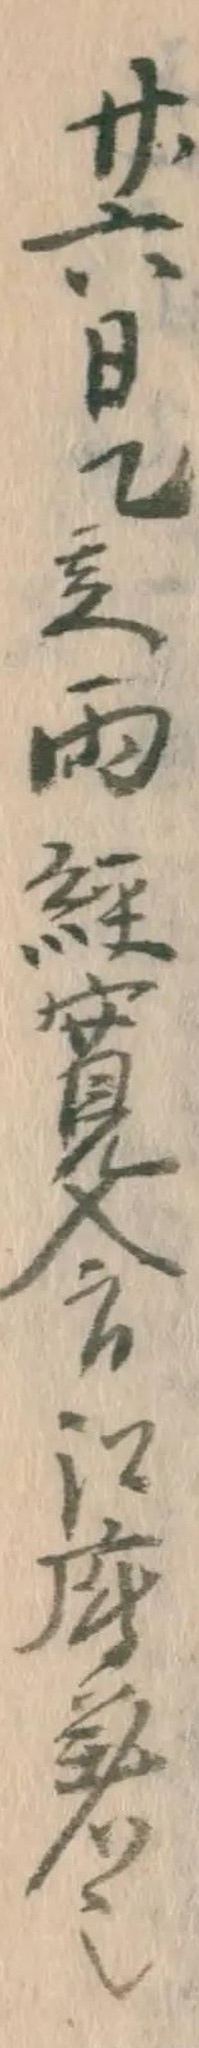廿六日乙亥雨経寛今日江府着也
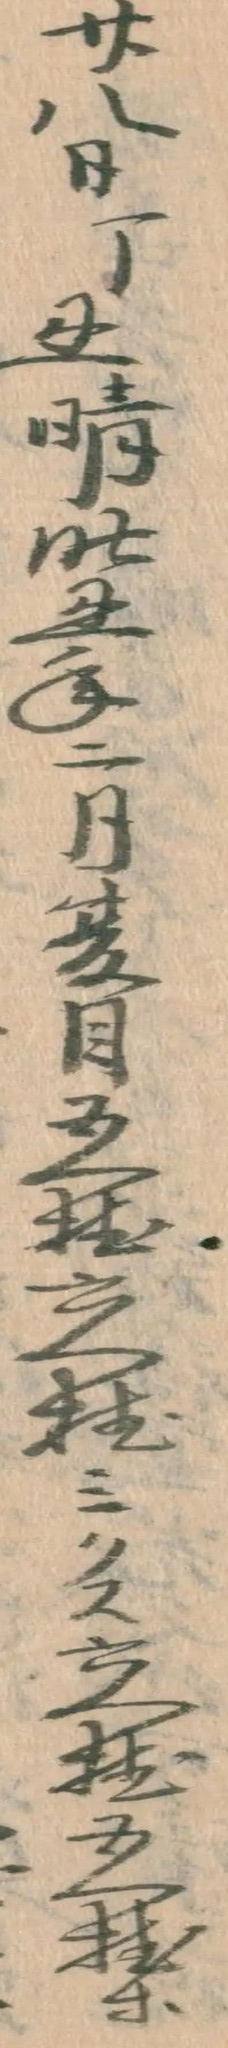廿八日丁丑晴昨丑年二月夏目五人植六人植ミクス六人植五人植等
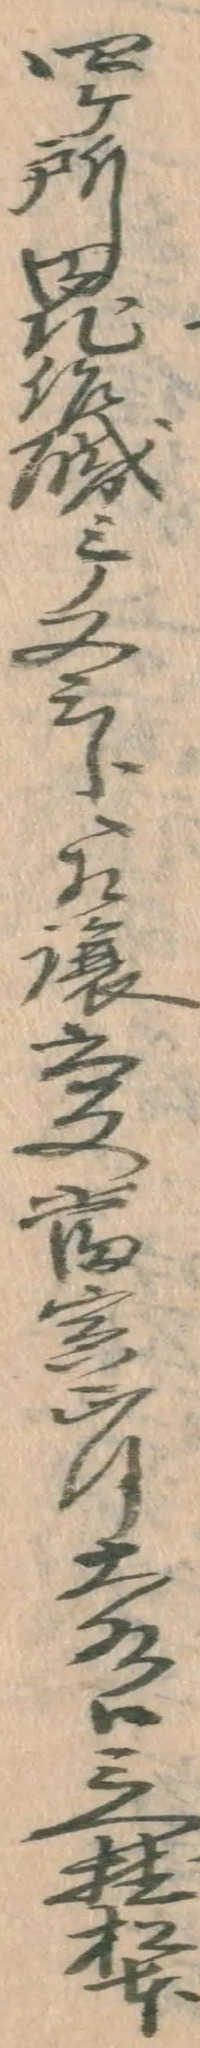四ケ所田地作職三ノ又三郎へ相譲尚又當寅正月大水口三人植松本
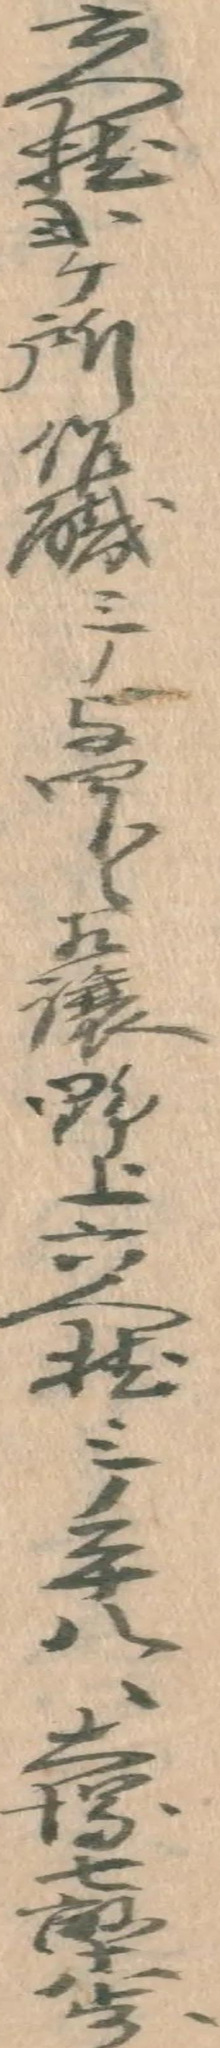六人植弐ケ所作職に三ノ与四郎相譲野上六人植三ノ平八へ大塚七畝十八歩
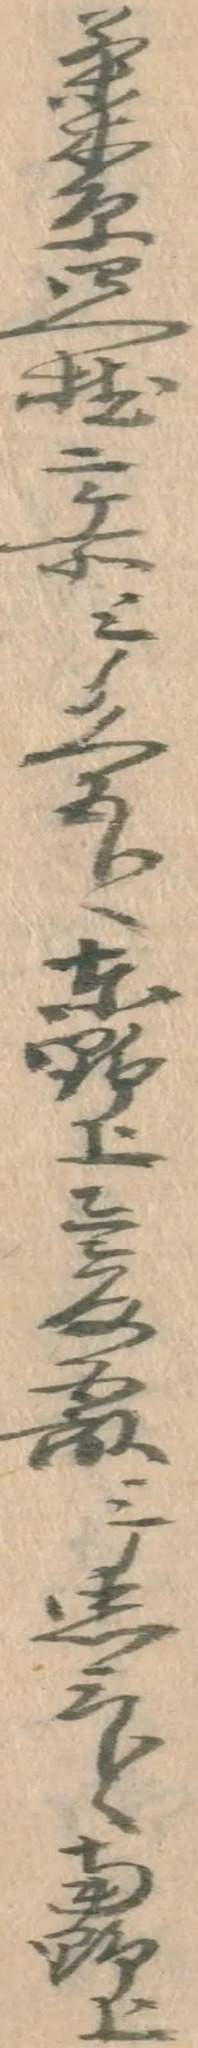菊米原四人植二ケ所三ノ久五郎へ東野上壱反五畝三ノ忠三郎へ両野上
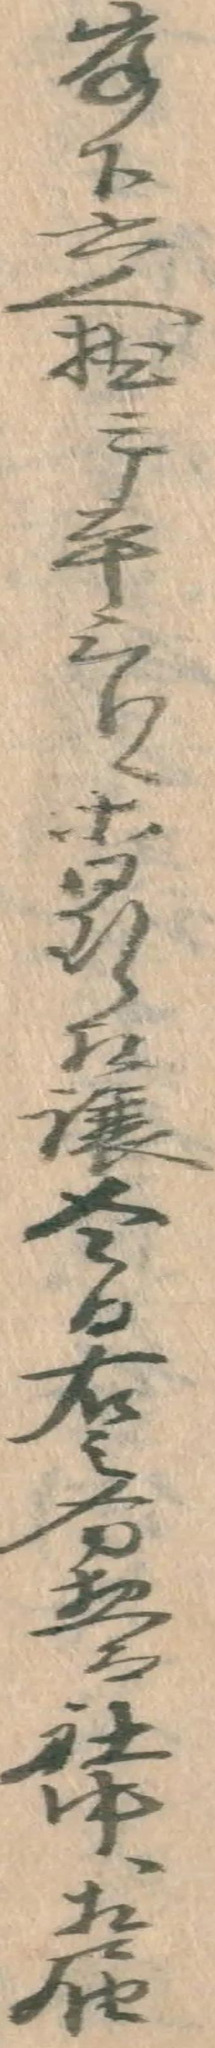岸下六人植三ノ平三歩へ等同断相譲今日右之分惣而社中へ相届了
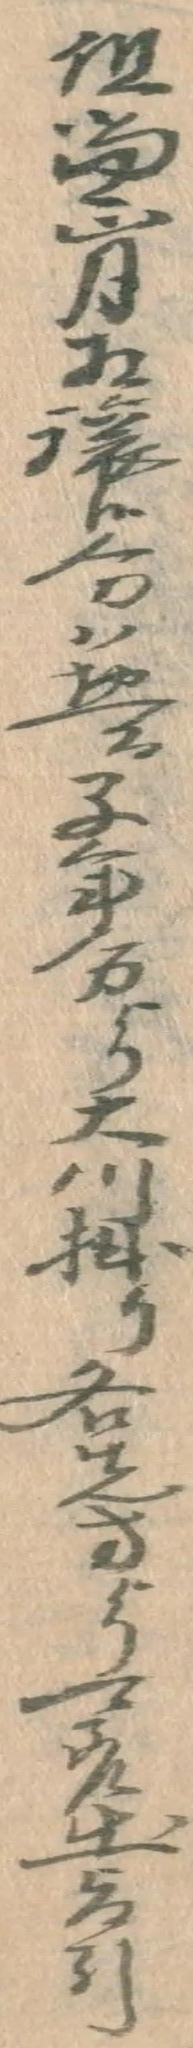但當正月相譲候分ハ惣而子年分より大川掛り各先方より可差出旨引
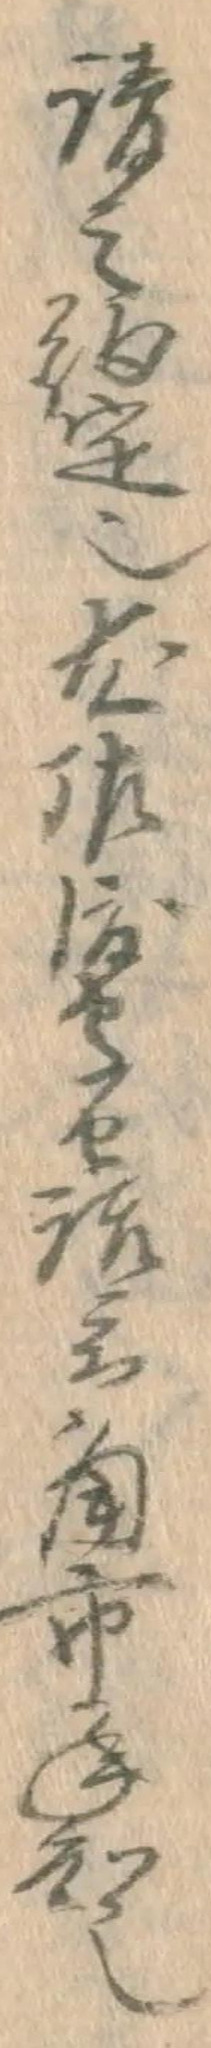請之約定也尤佐渡守世話ニ而角市承知也
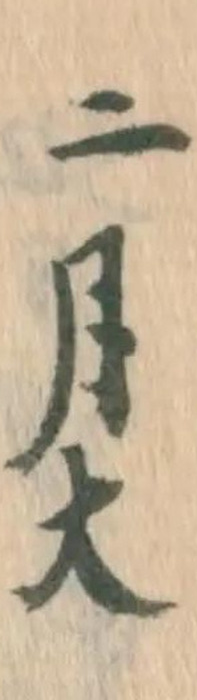二月大
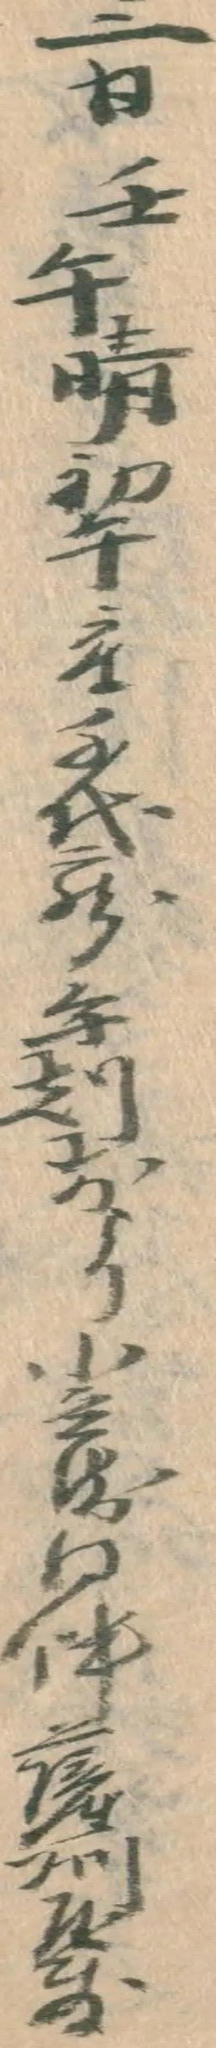三日壬午晴初午ニ付千代蔵午刻前より小兵衛日伝薩州屋敷
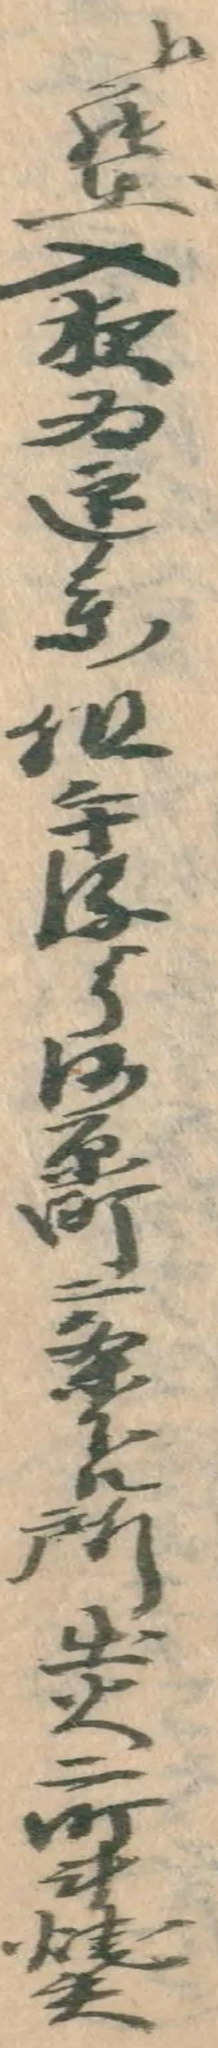え罷出入夜為迎参但午後より河原町二条下ル所出火二町斗焼失
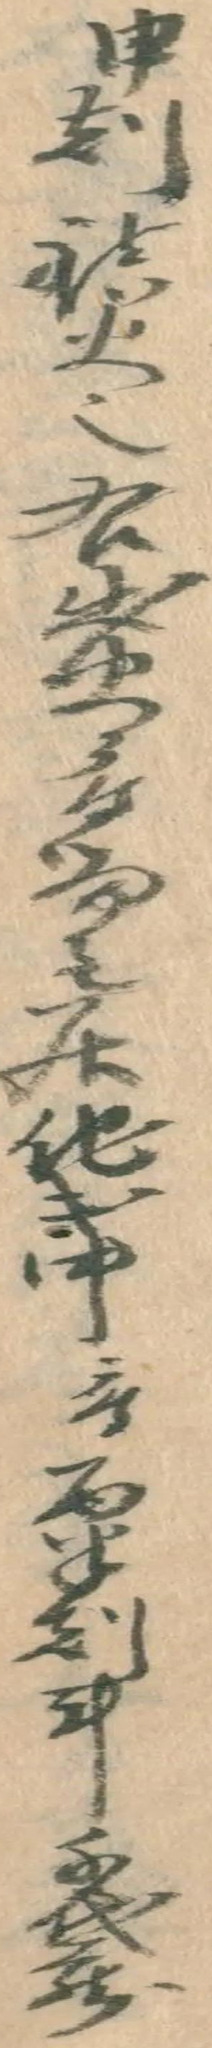申刻鎮火也右出火ニ付留主居他出中ニ付酉半刻斗千代蔵

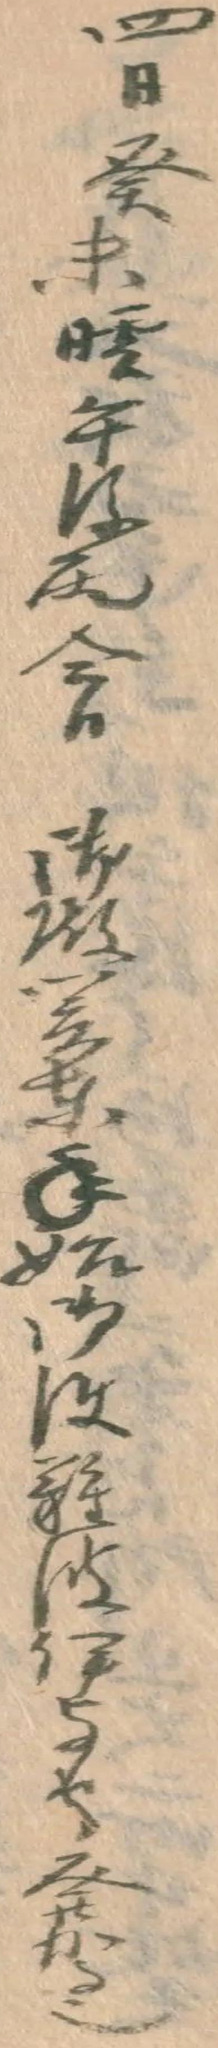四日癸未曇午後雨合日御殿関東年始御使難波伊豫守発駕也
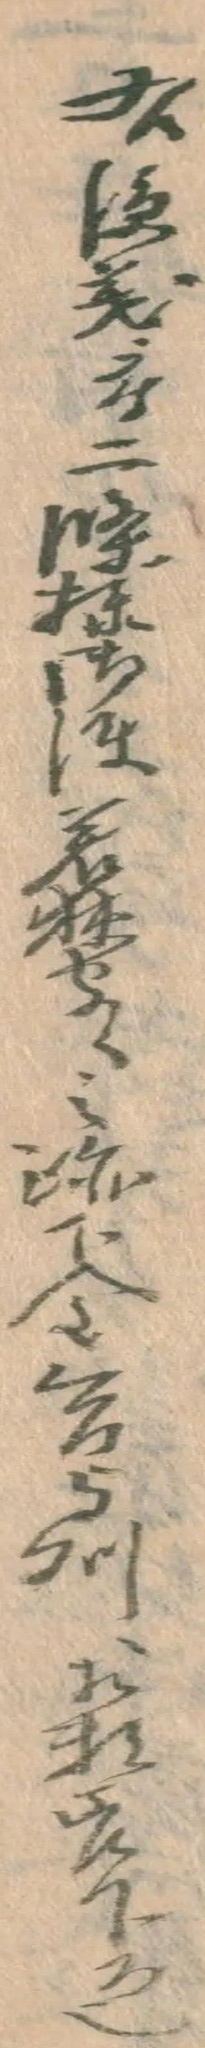右隠義ニ付二條様御使若狭守へ之跡下令今日与州へ相頼差下候也
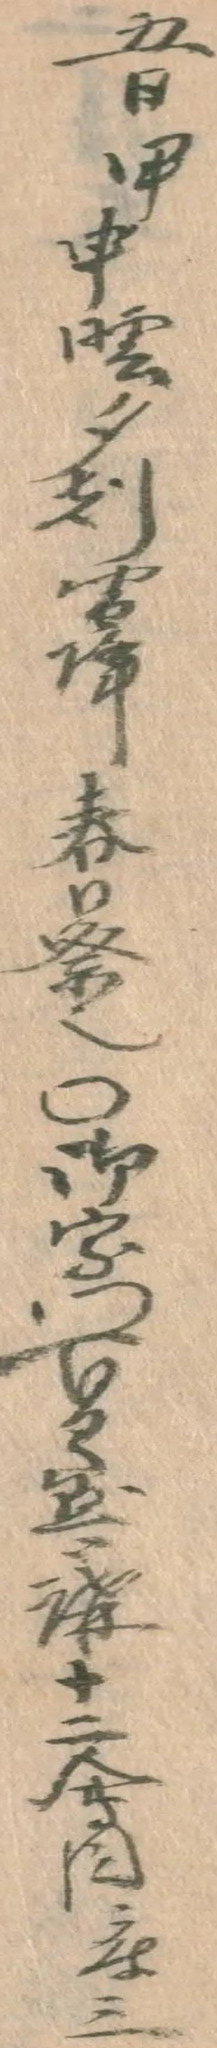五日甲申曇夕刻雪降春日祭也○御家門百匁懸講十二會目ニ付三
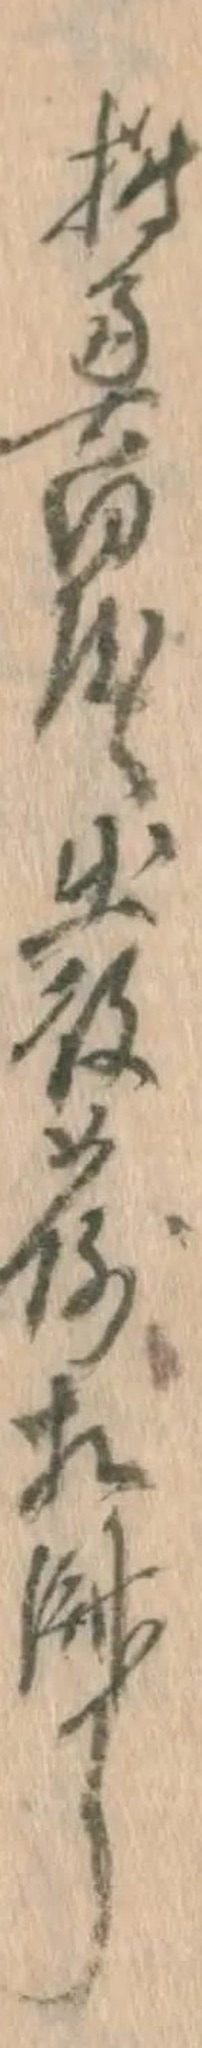樹奥田屋へ出役如例相済了
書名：賀茂社記録. 第69冊
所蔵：国立国会図書館 National Diet Library, JAPAN
